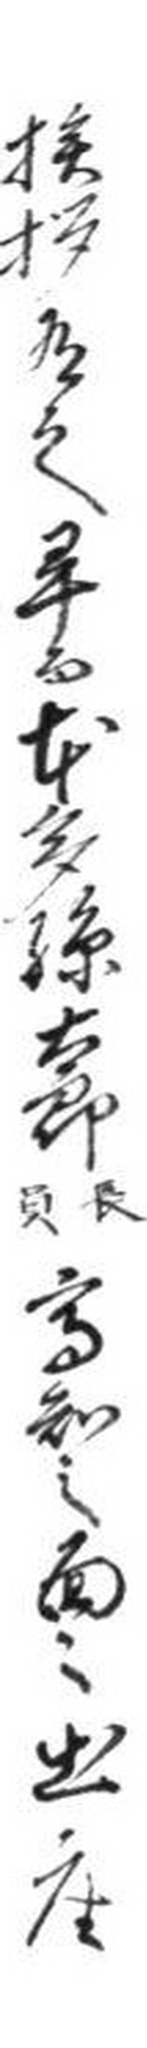挨拶有之畢而本多孫太郎長員高知之面々出座
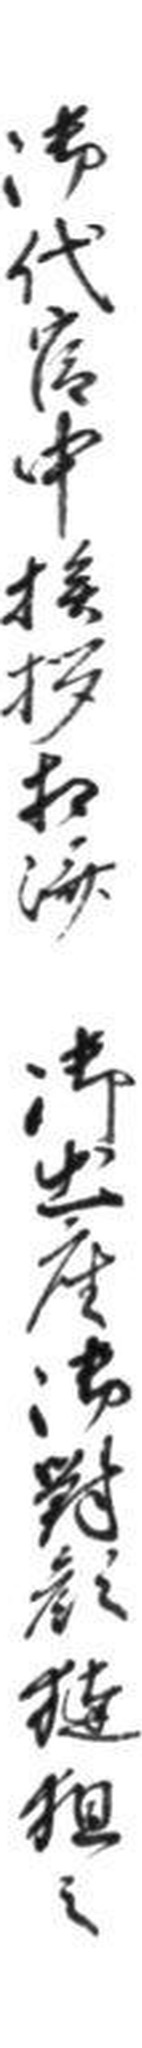御代官中挨拶相済御出座御対顔韃靼之
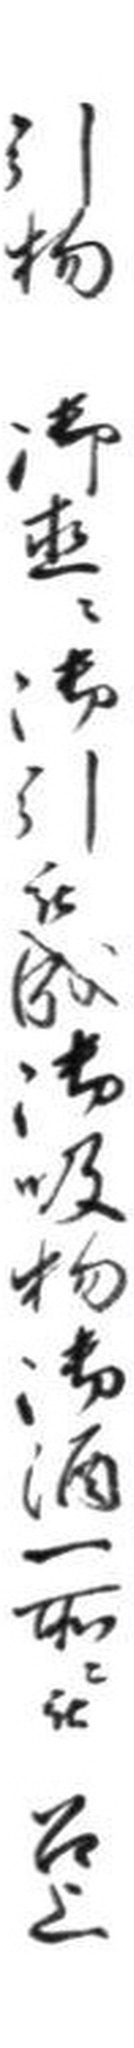引物御直に御引被成御吸物御酒一所に被召上
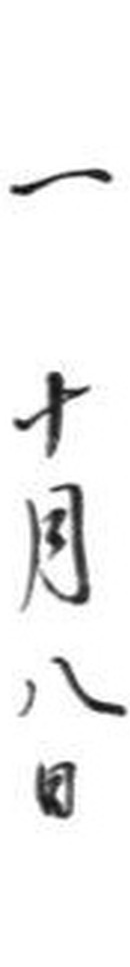一十月八日
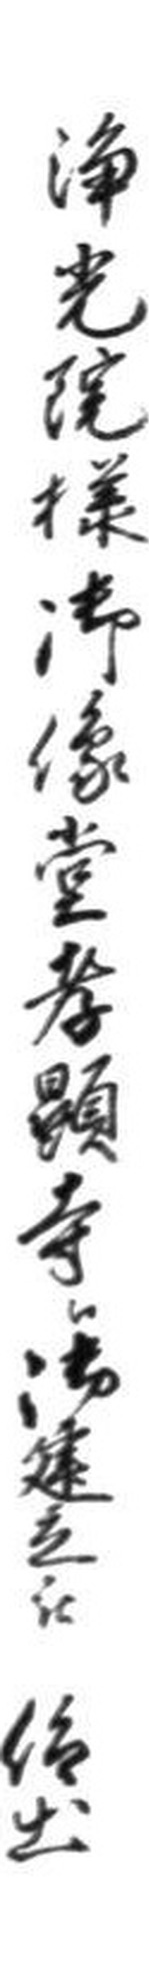浄光院様御像堂孝顕寺え御建立被仰出
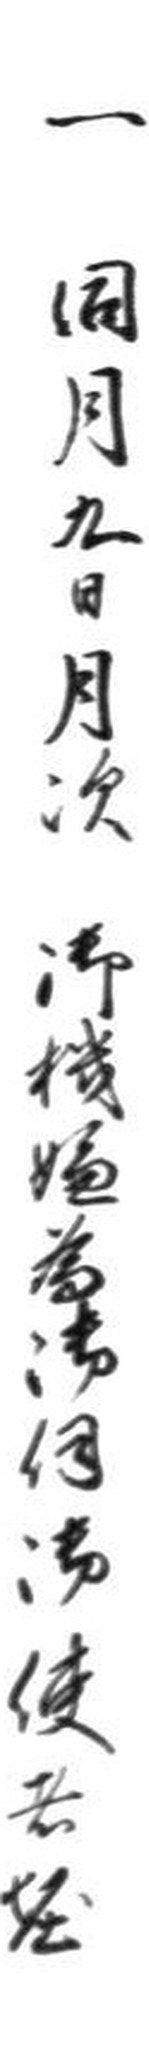一同月九日月次御機嫌為御伺御使者堀
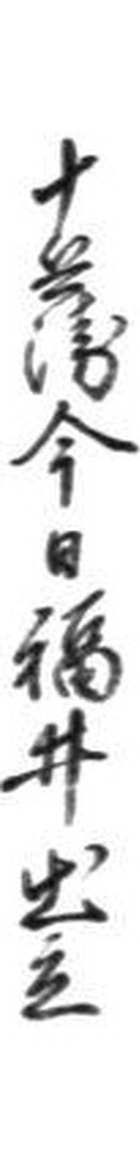十兵衛今日福井出立
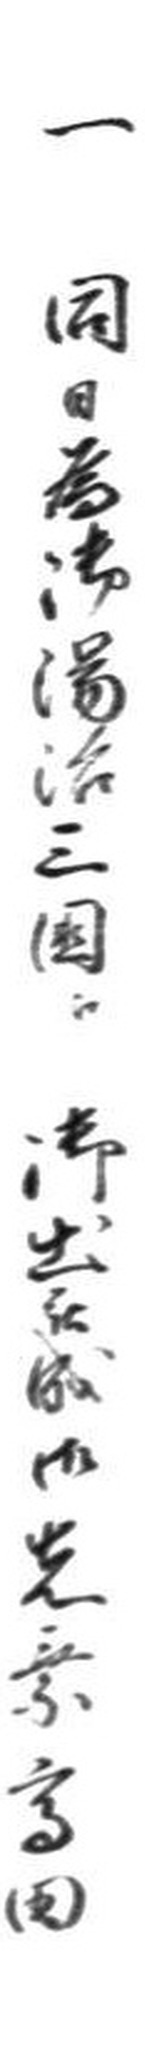一同日為御湯治三国え御出被成御先乗高田
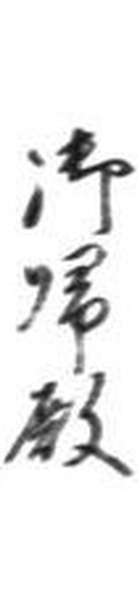御帰殿
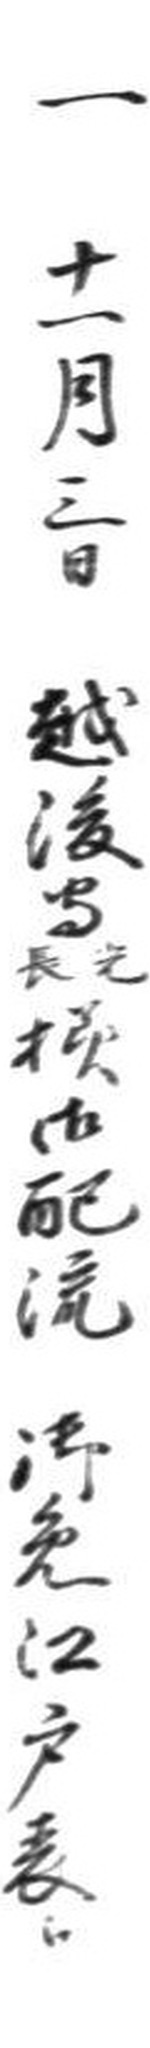一十一月三日越後守光長様御配流御免江戸表え

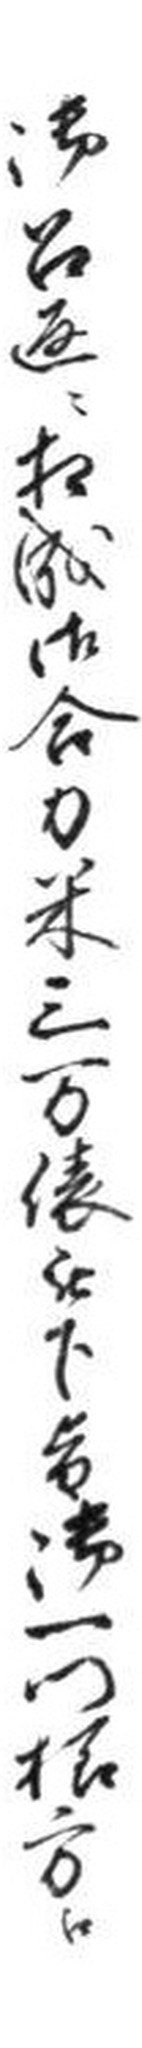御召返に相成御合力米三万俵被下旨御一門様方え
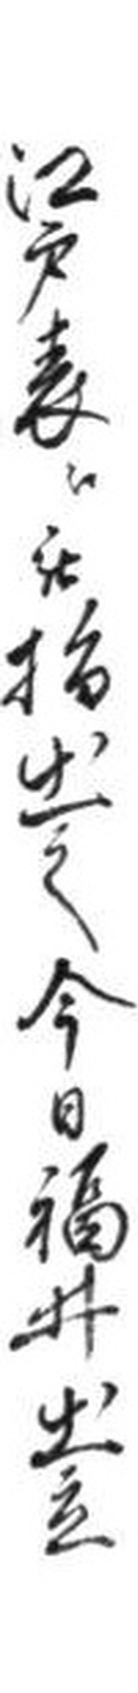江戸表え被指出之今日福井出立
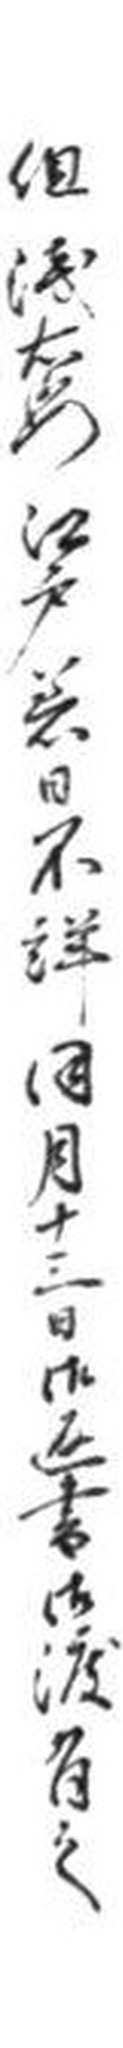但浅右衛門江戸着日不詳同月十三日御返書御渡有之
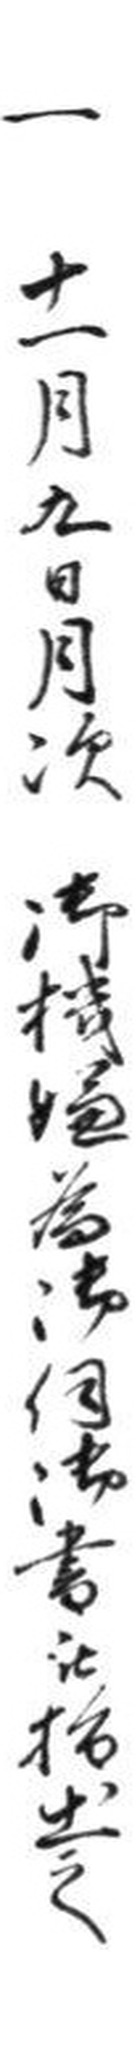一十一月九日月次御機嫌為御伺御書被指出之
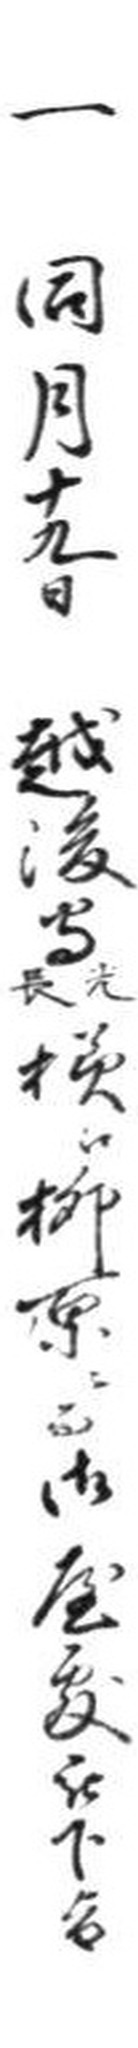一同月十九日越後守光長様え柳原に而御屋敷被下旨
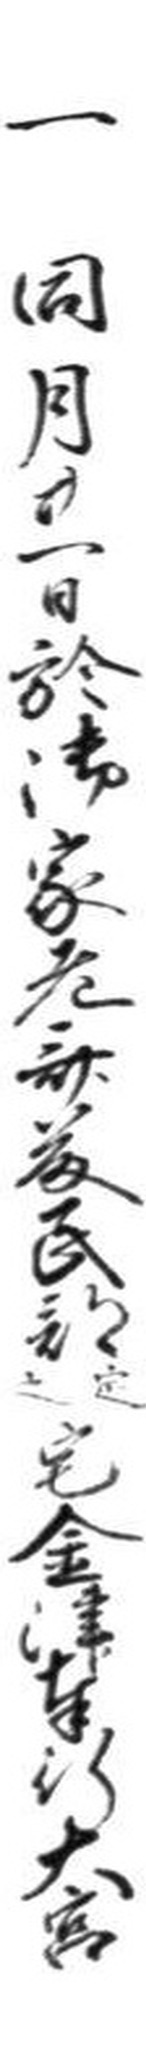一同月廿一日於御家老斎藤民部定之宅金津奉行大宮
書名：家譜 十六 吉品公 従貞享三年閏三月到同四年
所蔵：福井県文書館 Fukui Prefectural Archives
